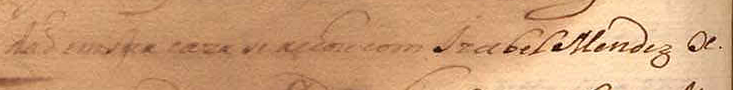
daõ em sua caza se achou com Izabel Mendez x.
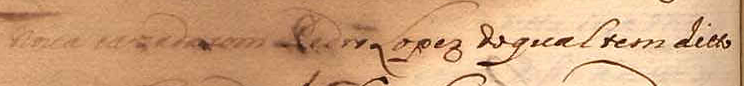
noua cazada com Pedro Lopez do qual tem ditto
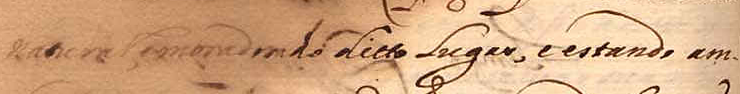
natural e morador do ditto Lugar, e estando am
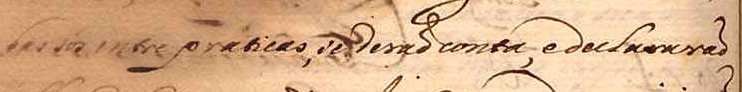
bos sós entre praticas, se deraõ conta, e declararaõ
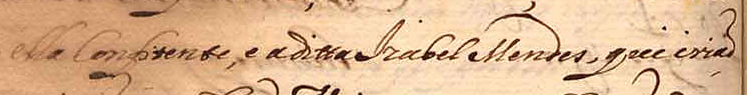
ella Confitente, e a ditta Izabel Mendes, que criaõ
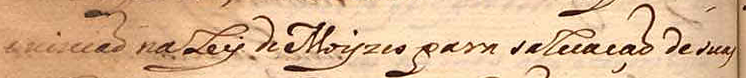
e uiuiaõ na Ley de Moyzes para saluaçaõ de suas
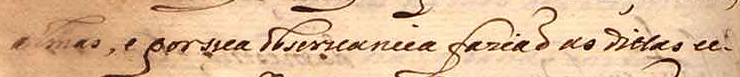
almas, e por sua obseruancia faziaõ as dittas ce
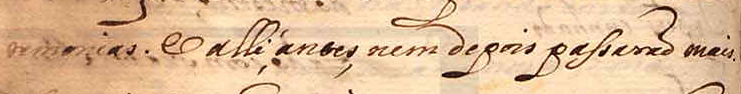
remonias. E alli, antes, nem depois passaraõ mais.
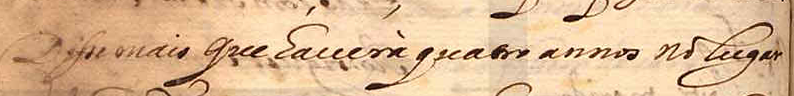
Disse mais que hauerà quatro annos no lugar
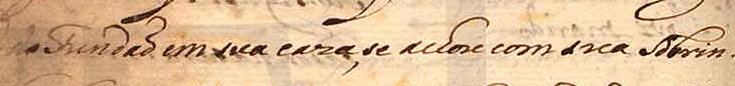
do Fundaõ em sua caza, se achou com sua sobrin
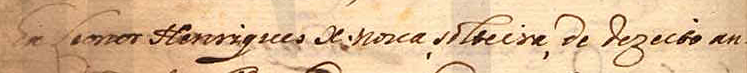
ha Leonor Henriques x. noua, solteira, de dezoito an
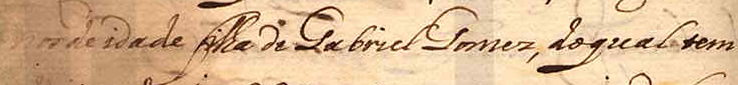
nos de idade filha de Gabriel Gomez, do qual tem
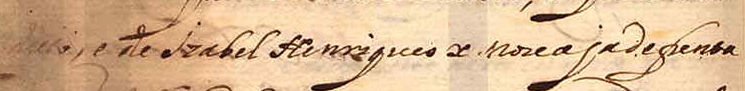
ditto, e de Izabel Henriques x. noua ja defunta
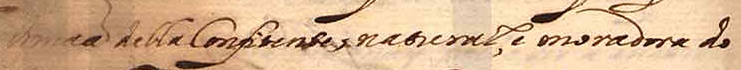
Irmaã della Confitente, natural, e moradora do
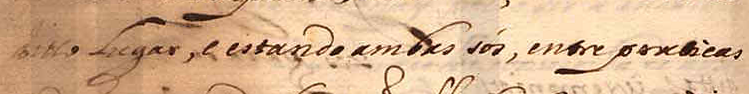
ditto Lugar, e estando ambas sós, entre praticas
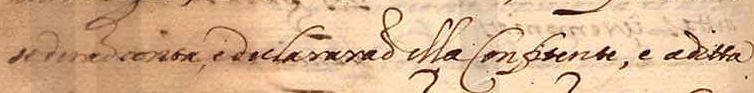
se deraõ conta, e declararaõ ella Confitente, e a ditta
